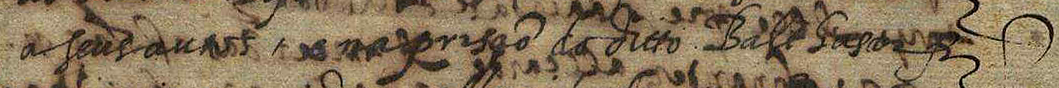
a seus autos, e na prisaõ do ditto Balthasar frz̄
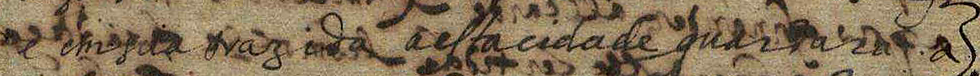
e em sua trazida a esta cidade guardara a
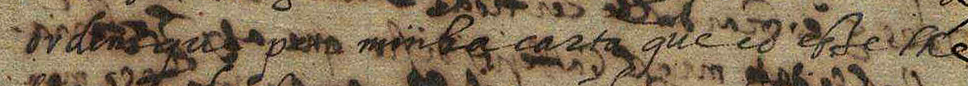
ordem que por minha carta que cō este lhe
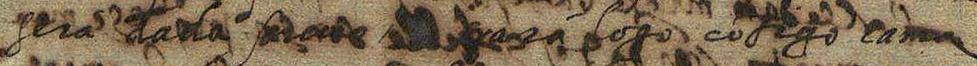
sera dada parte / _ trara logo cōsigo cama
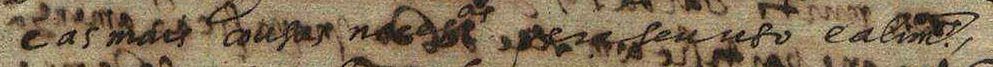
e as mais cousas necessas pera seu uso e alimtos.,
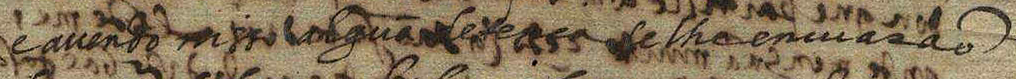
e auendo nisso alguā detença se lhe enuiaraõ
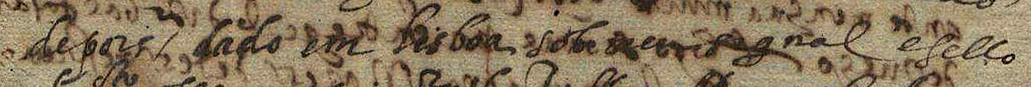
depois / dado em lisboa sob meu signal e sello
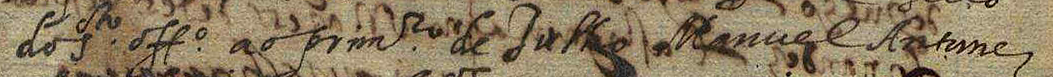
do sto. offo. ao prim.ro de Iulho Manuel Antunez
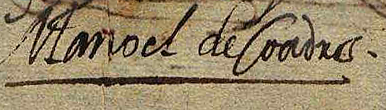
Manoel de Coadros.
